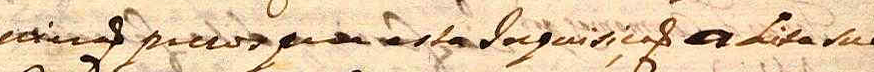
uieraõ prezos pera esta Inquisiçaõ a dita sua
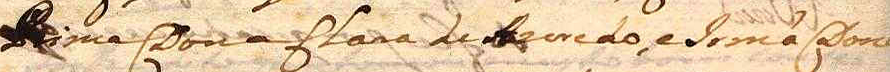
Prima Dona Clara de Azeredo, e Irmã Dona
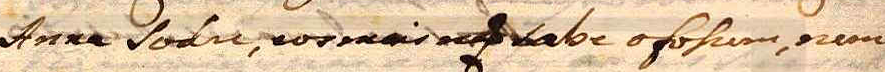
Anna Sodre, e os mais naõ sabe o fossem, nem
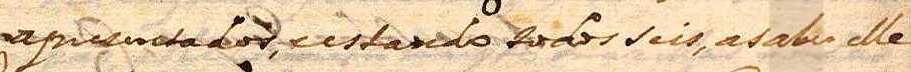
aprezentados, e estando todos seis, a saber elle
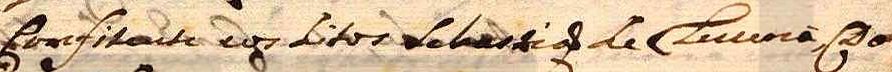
Confitente e os ditos Sebastiaõ de Lucena, Do
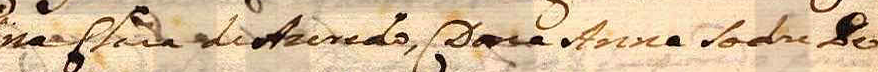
na Clara de Azeredo, Dona Anna Sodre Pe
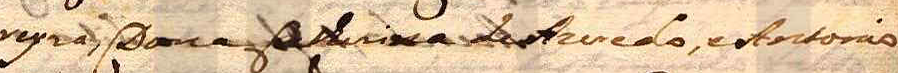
reyra, Dona Catherina de Azeredo, e Antonio
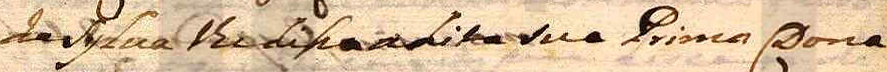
da Sylua lhe disse a dita sua Prima Dona
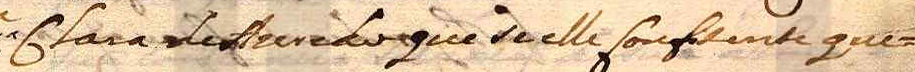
Clara de Azeredo que se elle Confitente que
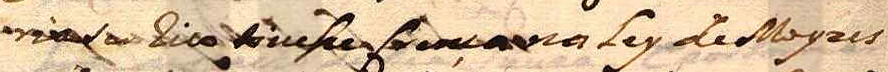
ria ser rico tiuesse Crença na Ley de Moyzes
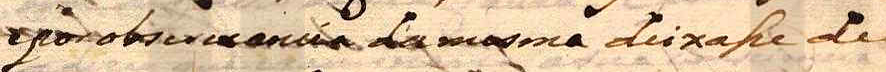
e por obseruancia da mesma deixasse de
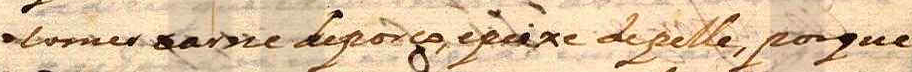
comer carne de porco, e peixe de pelle, porque
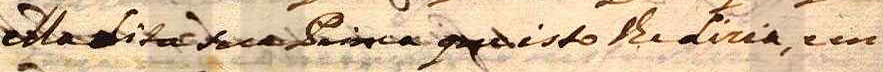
ella dita sua Prima que isto lhe dizia, e en
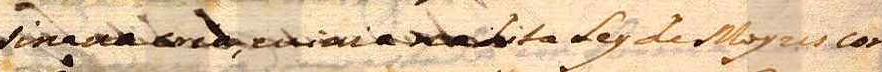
sinaua crer, e uiuia na dita Ley de Moyzes com
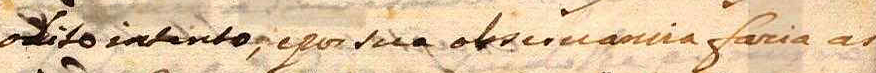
o dito intento, e por sua obseruancia fazia as
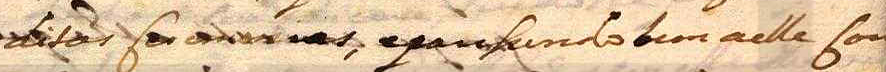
ditas Ceremonias, e paressendo bem a elle Con
